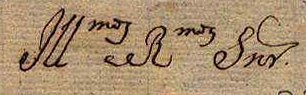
Ill.mos e R.mos Snr.s
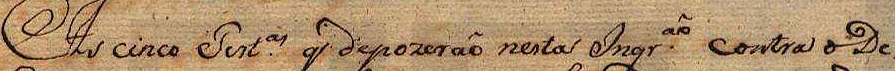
As cinco Test.as q̄ depozeraõ nesta Inqr.aõ contra o De
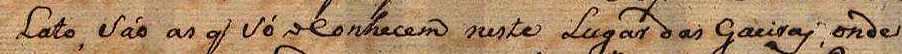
Lato, são as q̄ só o conhecem neste Lugar das Gaeiras, onde
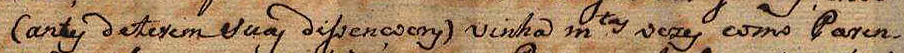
(antes de terem suas dissençoens) vinha m.tas vezes como Paren
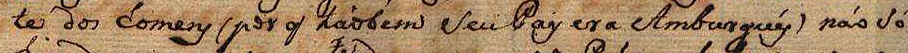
te dos homens (porq̄ taõbem seu Pay era Amburgués) naõ só
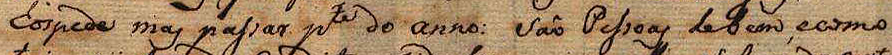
hospede mas passar p.te do anno: saõ Pessoas de bem e como
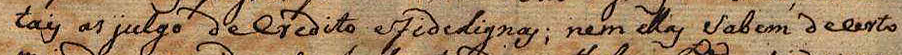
tais as julgo de Credito e fidedignas; nem ellas sabem de certo
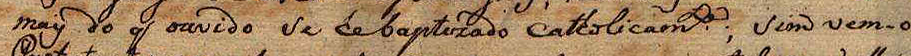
mais do q̄ ouvido se he baptizado catholicam.te; sim vem-o
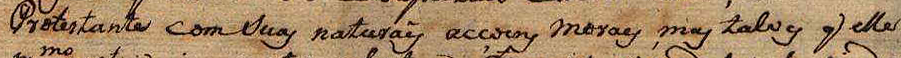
Protestante com suas naturais acçoens moraes, mas talves q̄ elle
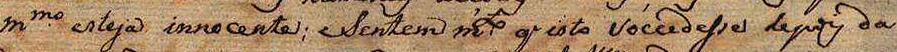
m.mo esteja innocente; e Sentem m.to q̄ isto soccedesse depois da
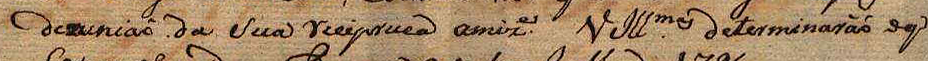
dezuniaõ da sua recipruca amiz.e V Ill.mas determinaraõ o q̄
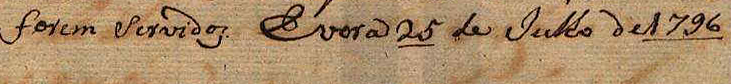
forem servidos Evora 20 de Iulho de 1796
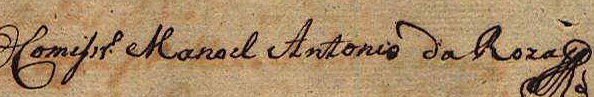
Comissr.o Manoel Antonio da Roza
